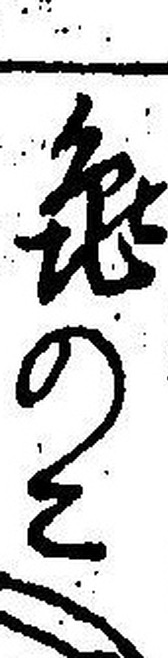亀のこ

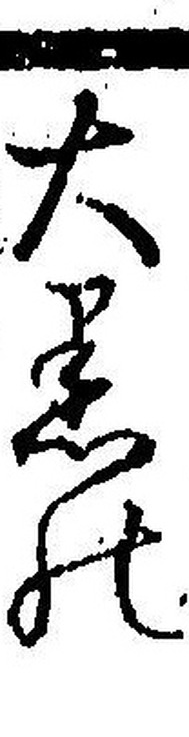大黒の
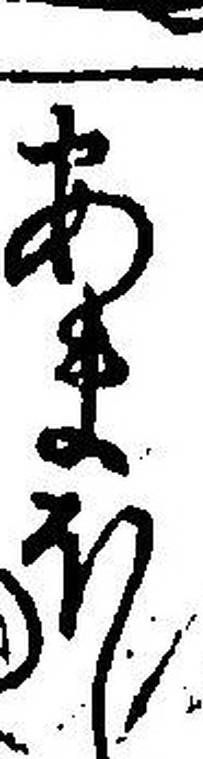あまほし
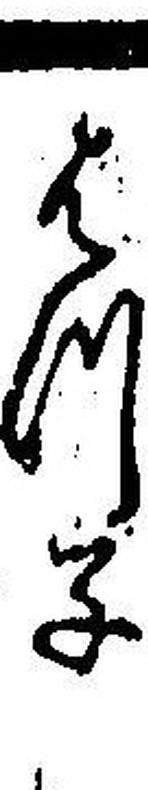はつ子
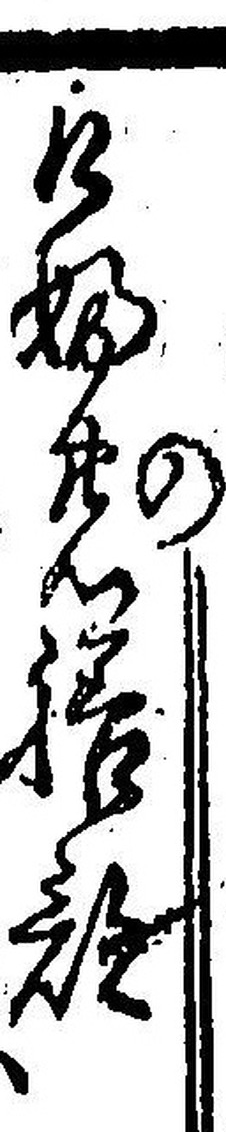けふの膳部
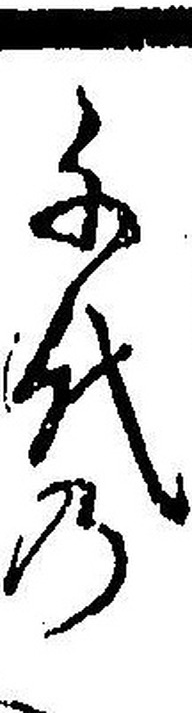千代の
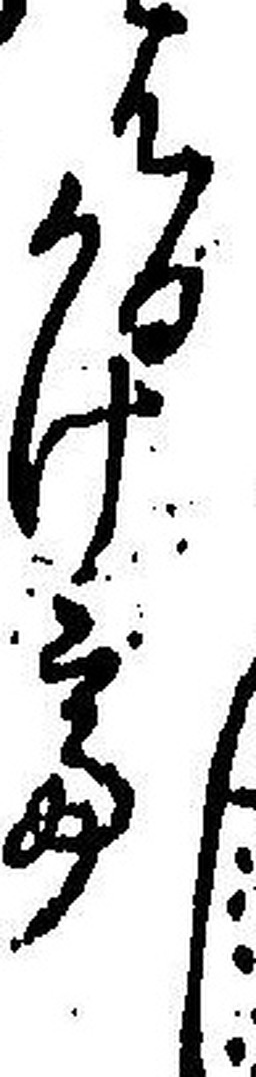かけて
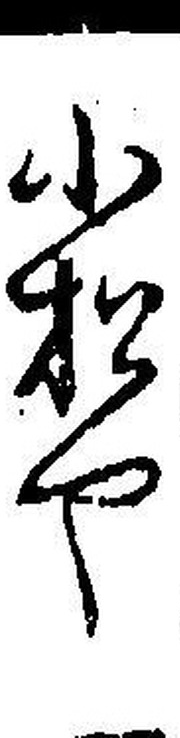小松や
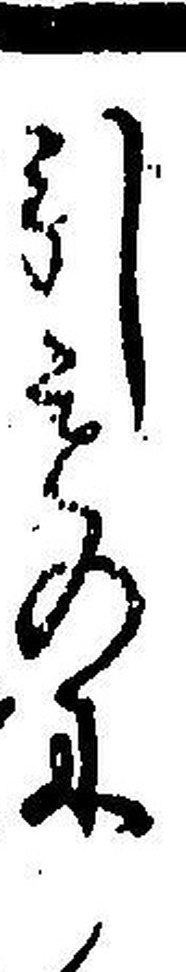引ものに
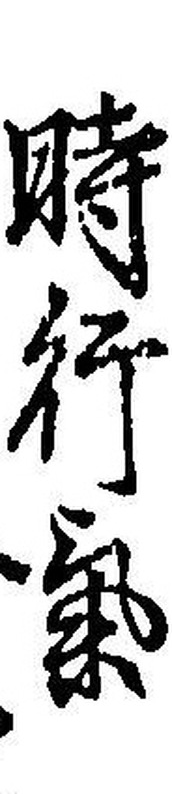時行気
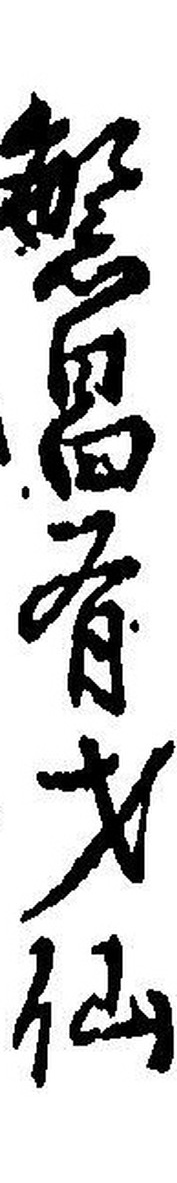繁昌有才仙
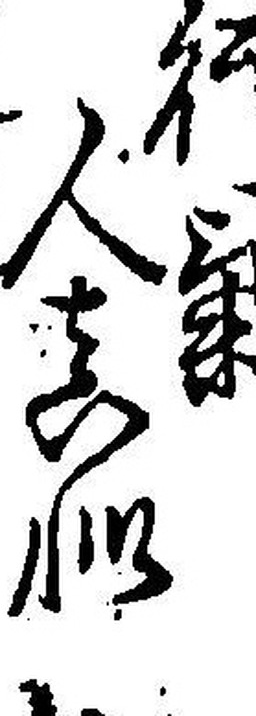人真似
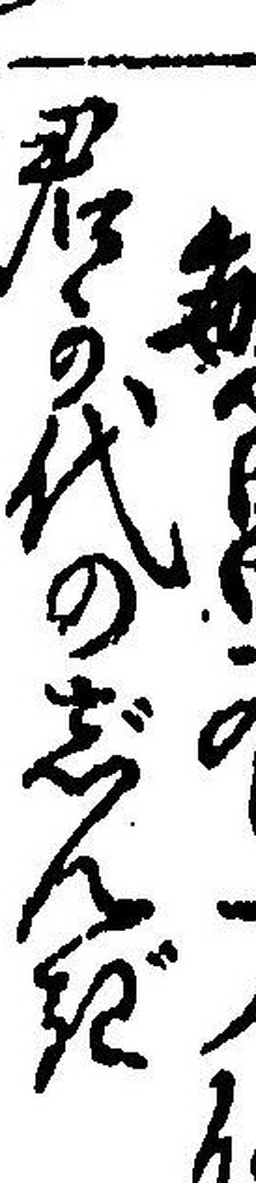君か代のじんぎ
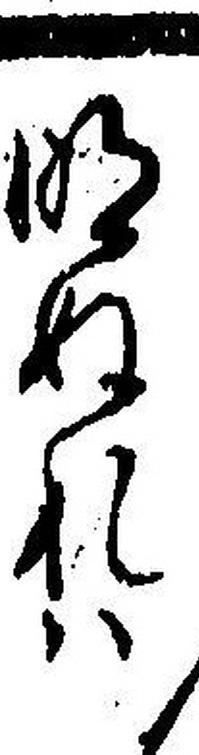明ぬれは
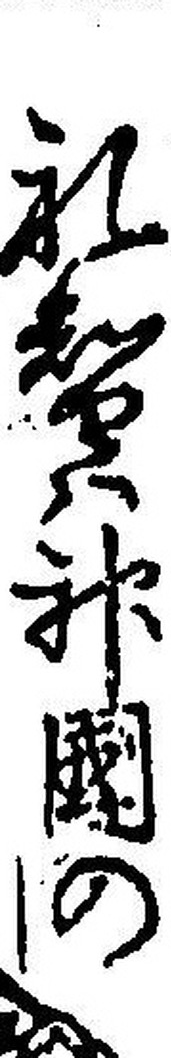礼智は神国の
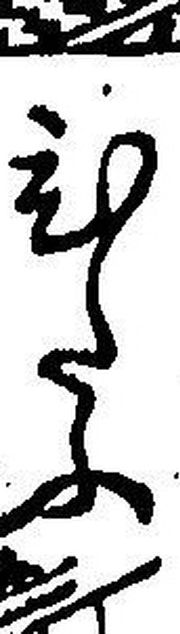ひたふ
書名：どうれ百人一首 / 鹿都部真顔(狂歌堂)編
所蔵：東京大学総合図書館 General Library in the University of Tokyo, JAPAN
